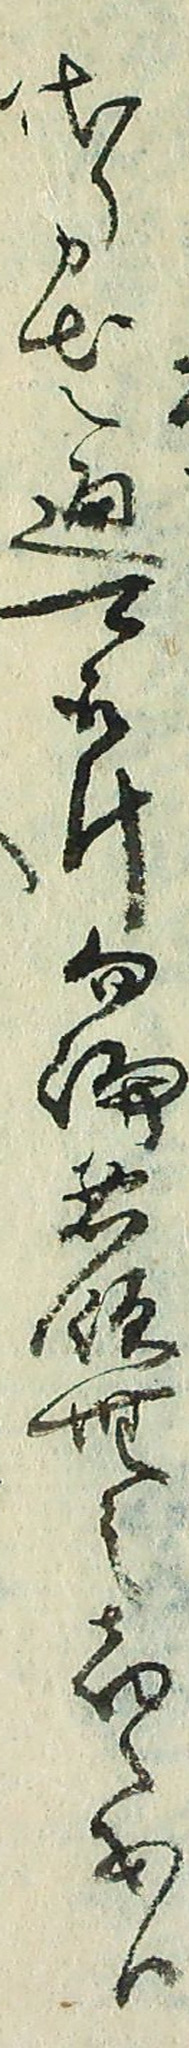代り申出之通可取計勿論惣領無之者之義ハ
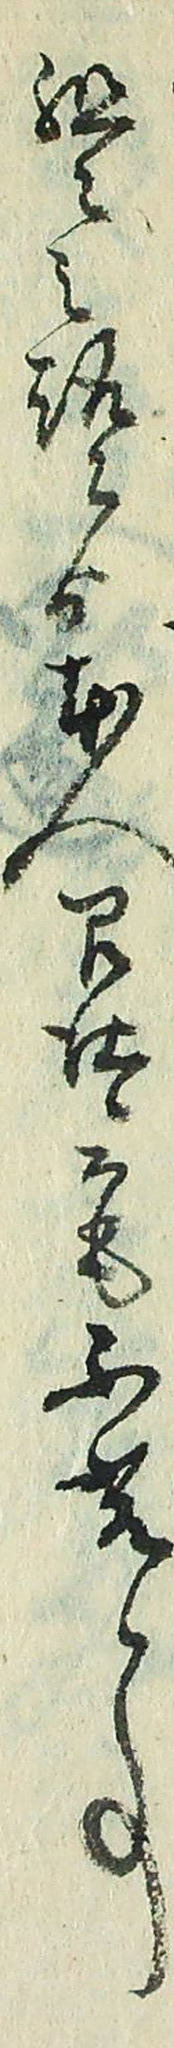組々之趣ニゟ本人召仕候而も不苦候事
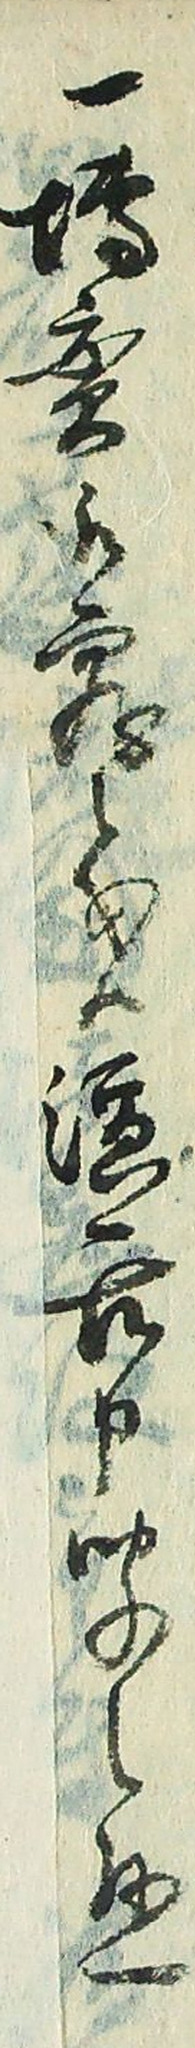一博奕取究之義ハ演舌申聞之通
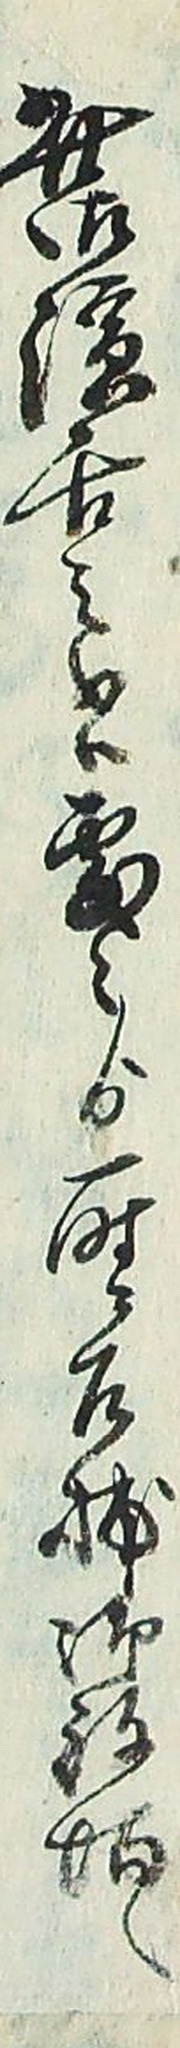此御演舌之義ハ處々ゟ一時ニ召捕御役場へ
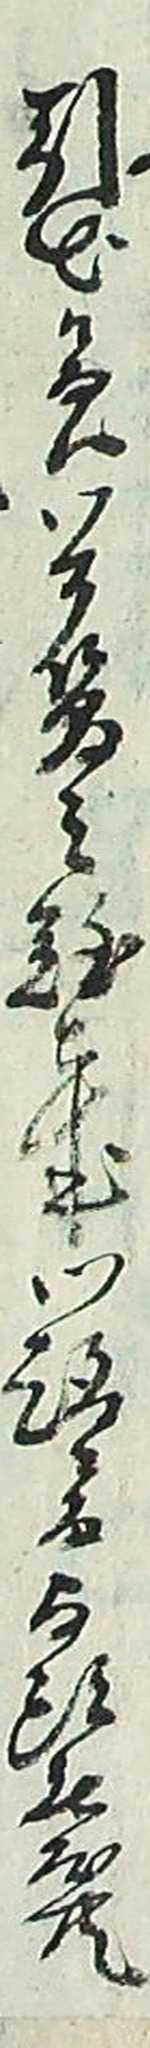引出候而ハ御了簡之難被成御趣ニ而与頭庄屋共
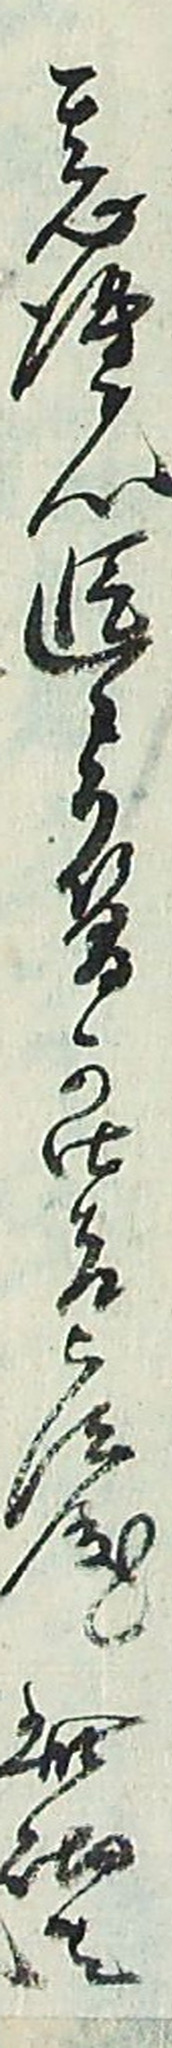其心得ヲ以追々了簡可仕旨被仰渡候此砌者
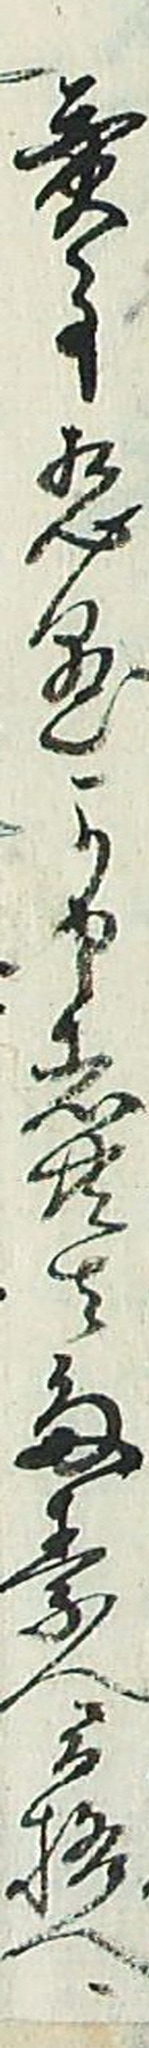奕事相心懸可申者共者多素人ニ而挌人
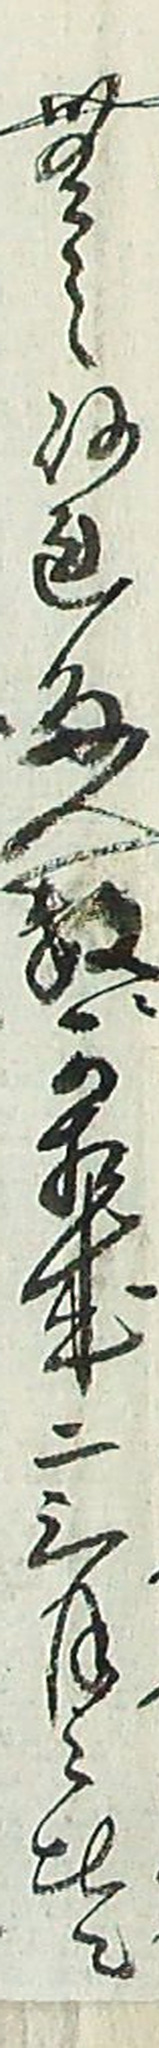無之何れ多人数ニ可相成二三月之比ニ
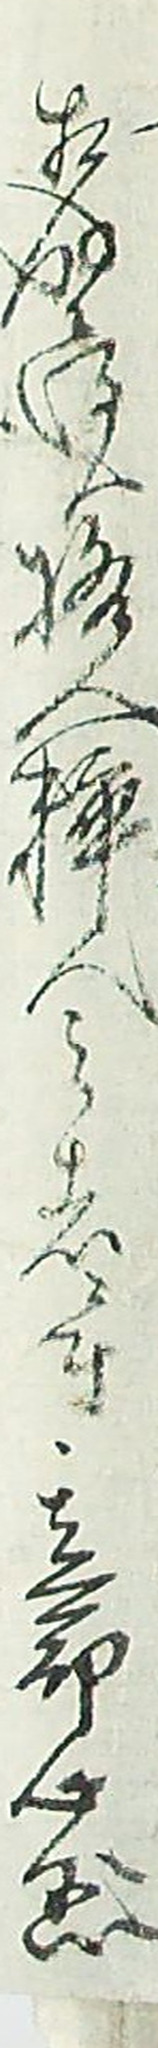相成候得ハ挌人粹人之者ニ付其節心懸
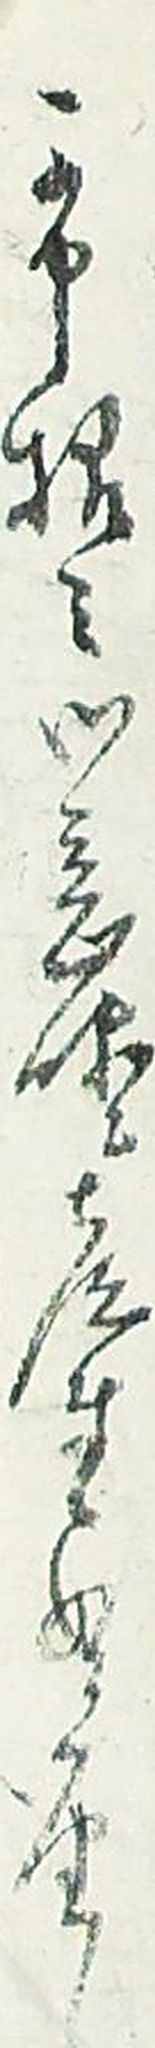可申様之御意味ニ被仰付候義ニ御座候

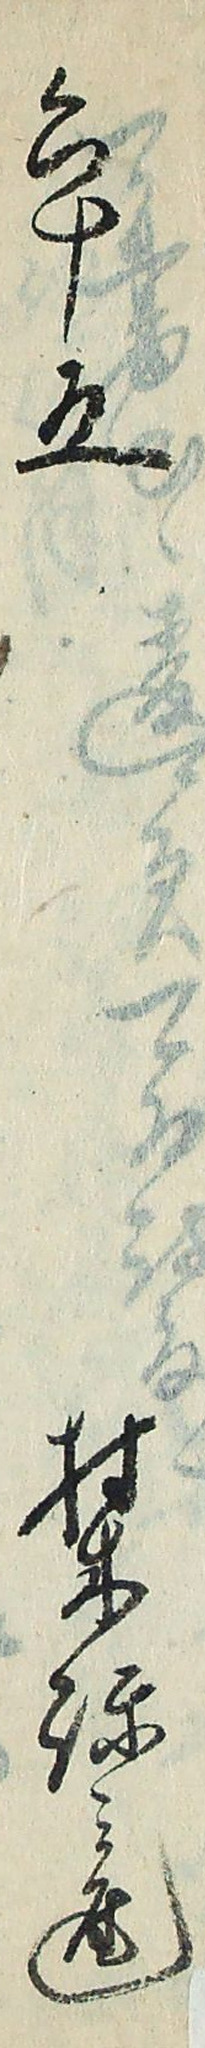六十五村木保之進
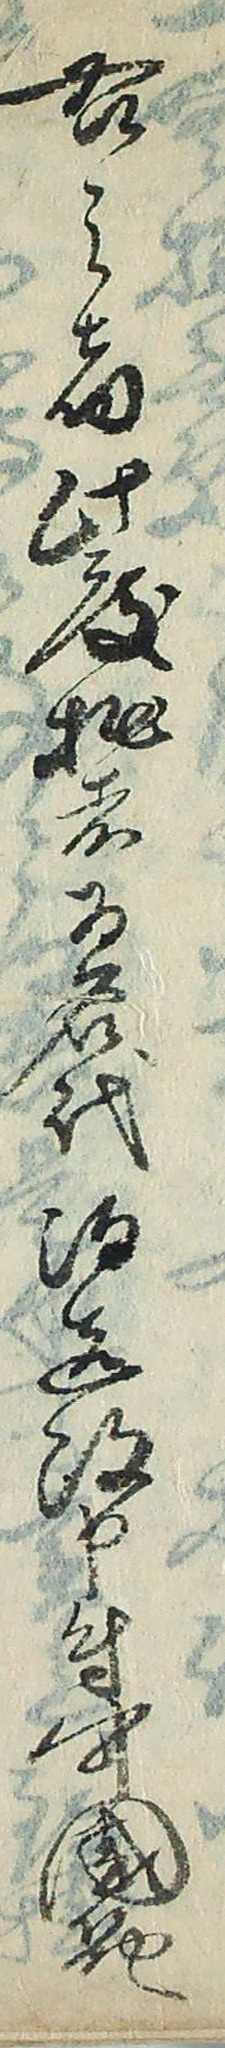右之者此度拙者為名代酒造改申付中國筋へ
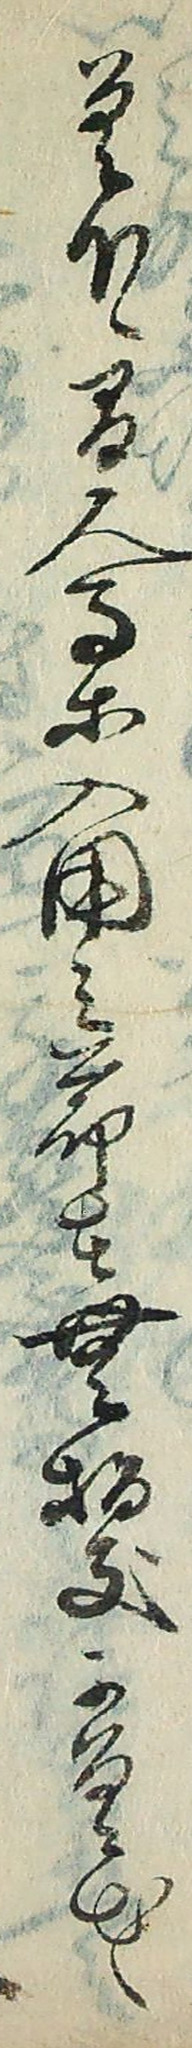差下候間人馬等入用之節者無指支可差出候
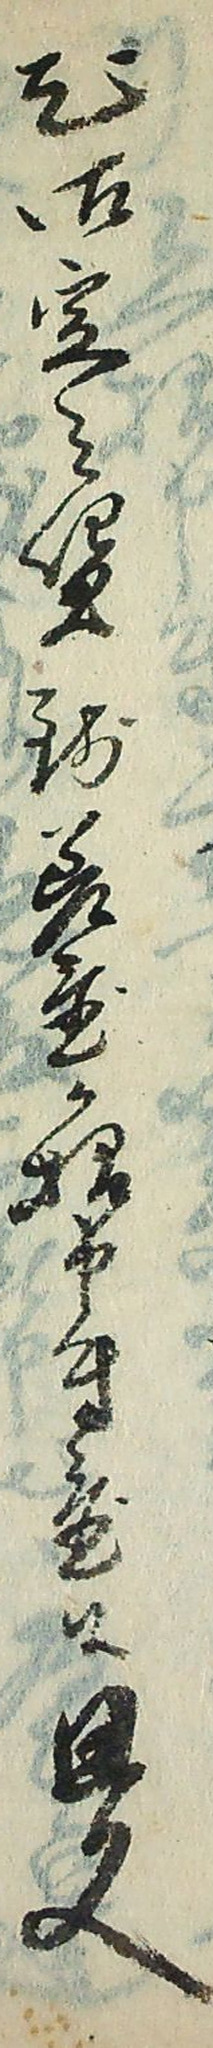尤御定之賃銭差置候様申付置候且又
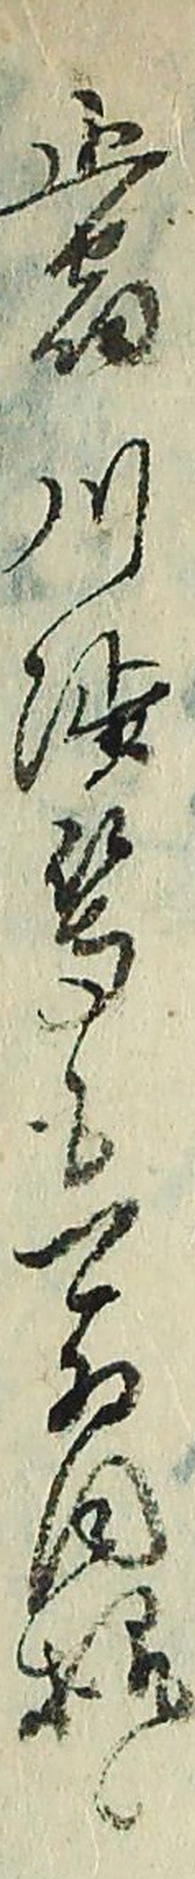止宿川渉等も可為同様候
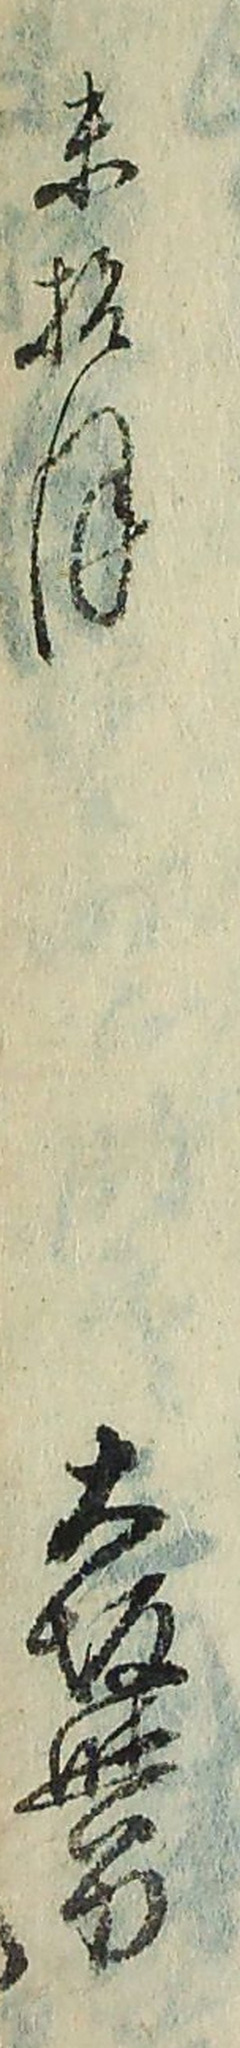未拾月大坂與力
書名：諸御趣意書并御下知向之写
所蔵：鳴門教育大学 Naruto University of Education
